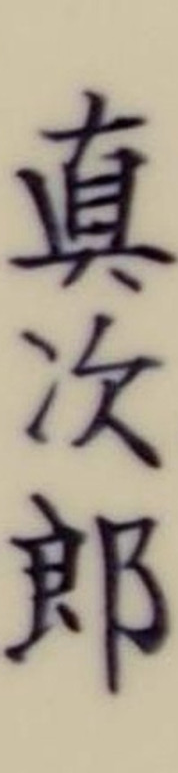真次郎
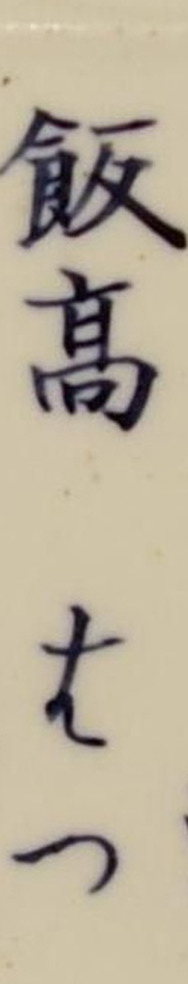飯高はつ
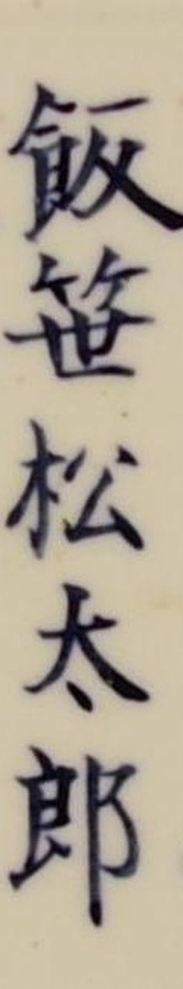飯笹松太郎
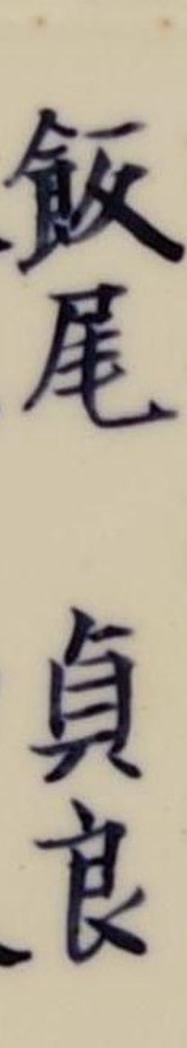飯尾貞良
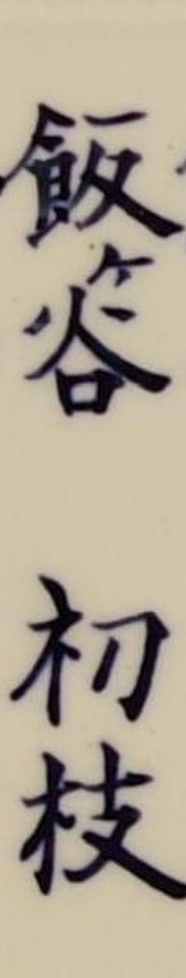飯ヶ谷初枝
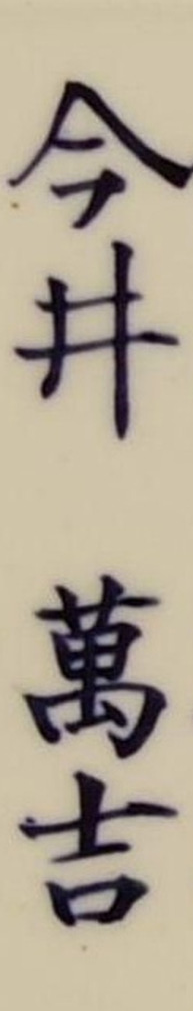今井萬吉
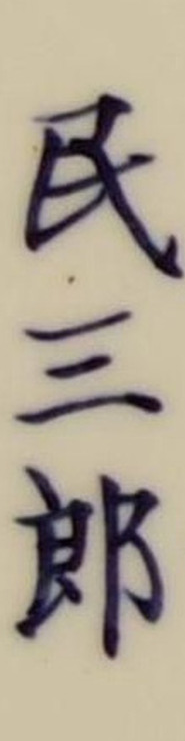民三郎
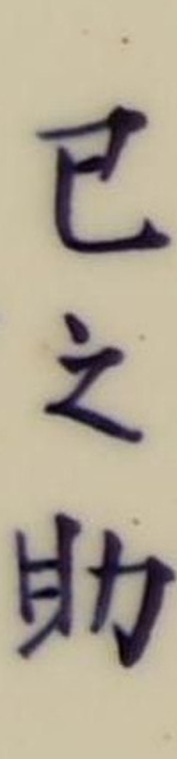巳之助

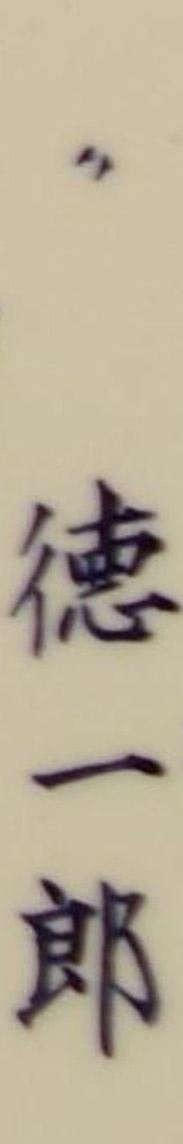徳一郎
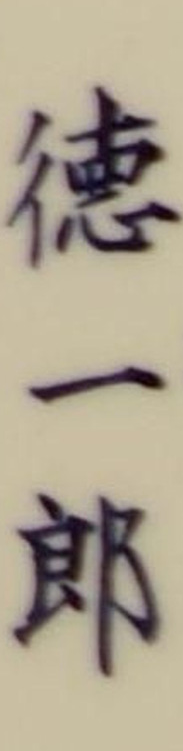徳一郎
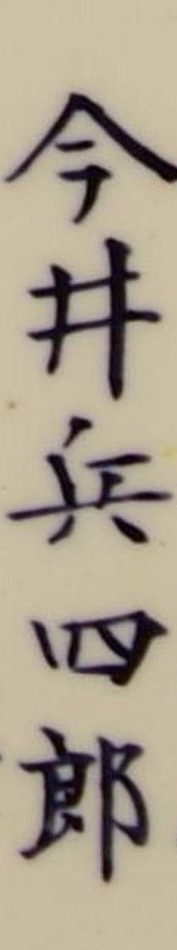今井兵四郎
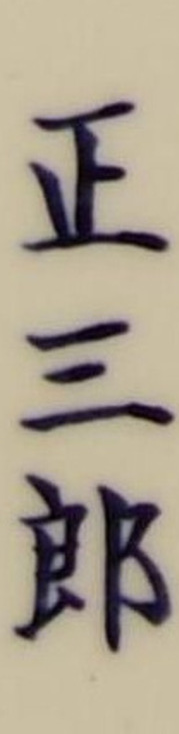正三郎
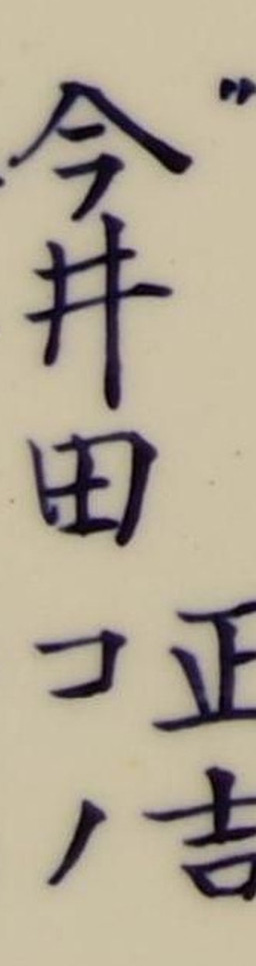今井田コノ
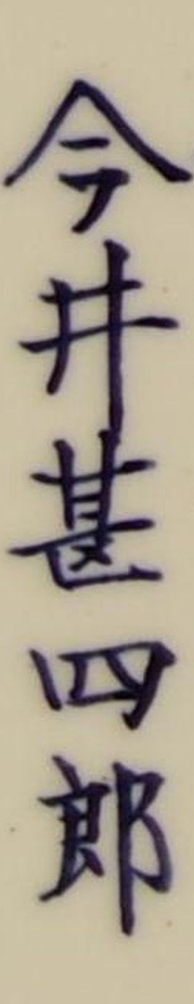今井甚四郎
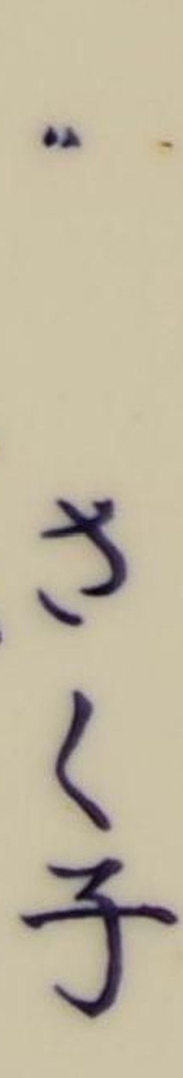さく子
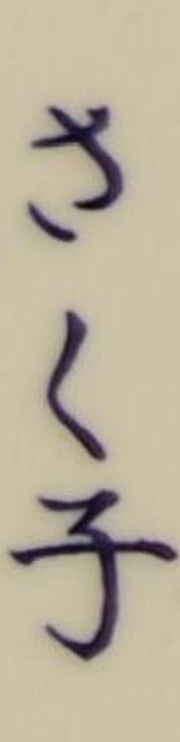さく子
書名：A~D
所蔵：koyasan kongobuji
